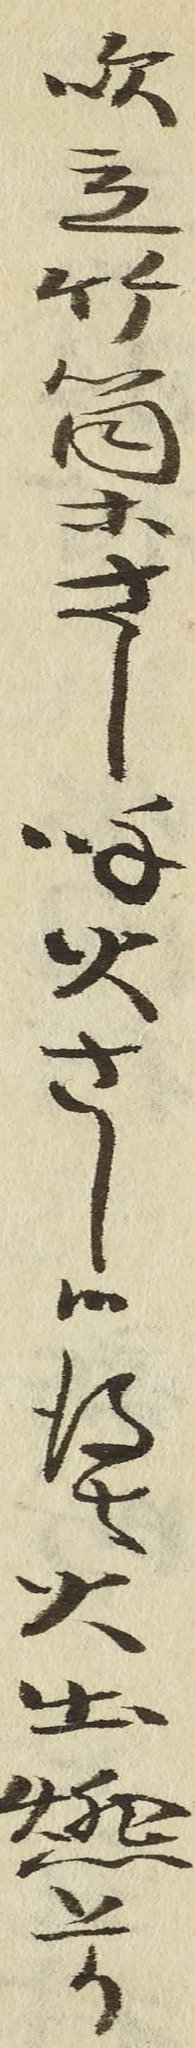吹立竹筒等さし呼火さし候得は火出燃上り
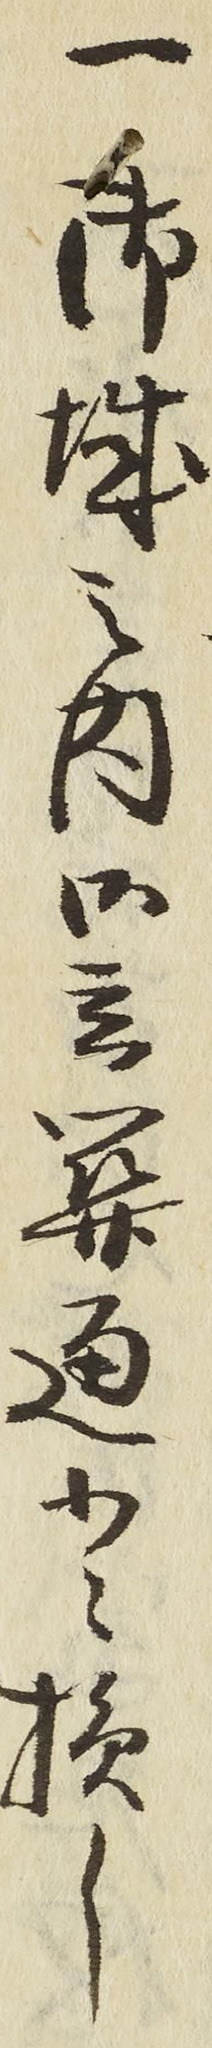一御城之内御玄関通少々損し
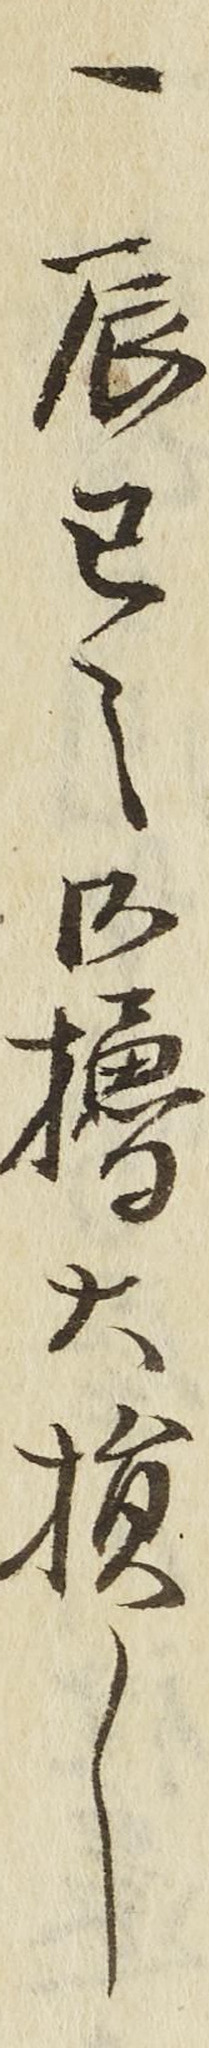一辰巳之御櫓大損し
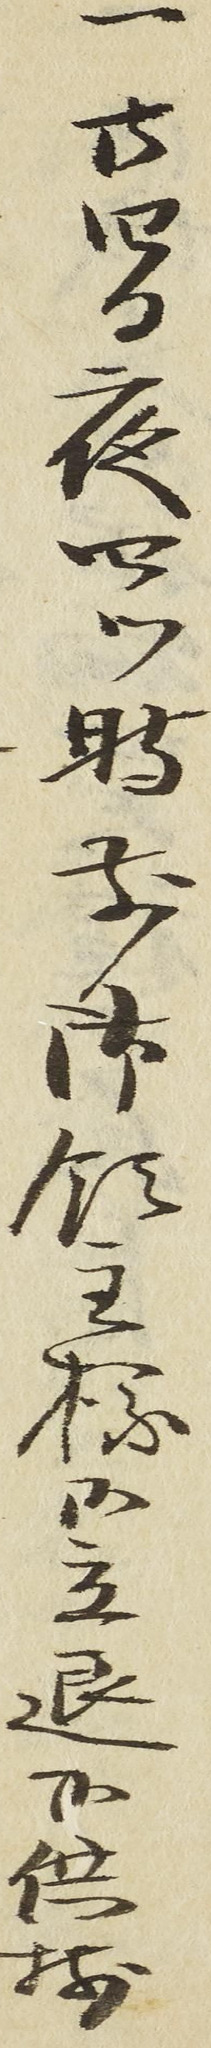一廿四日夜四ッ時前御領主様御立退御供揃
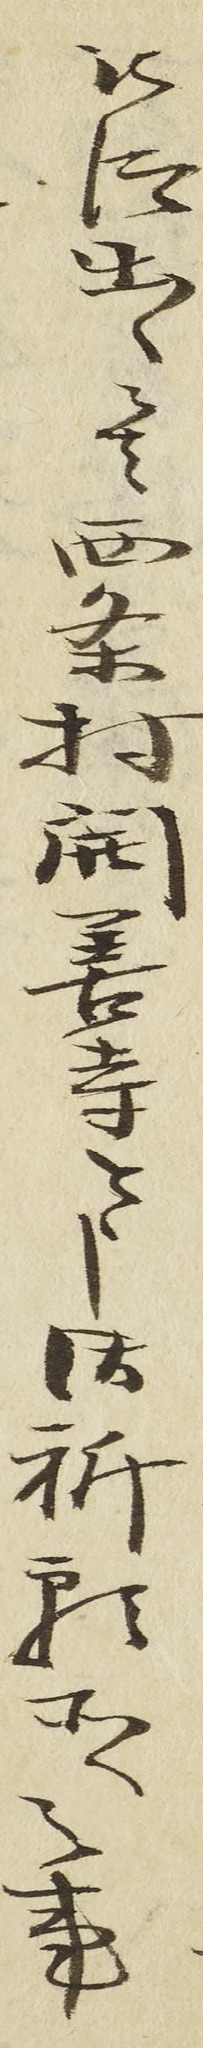被仰出候二は西条村開善寺と申御祈願所へ之事
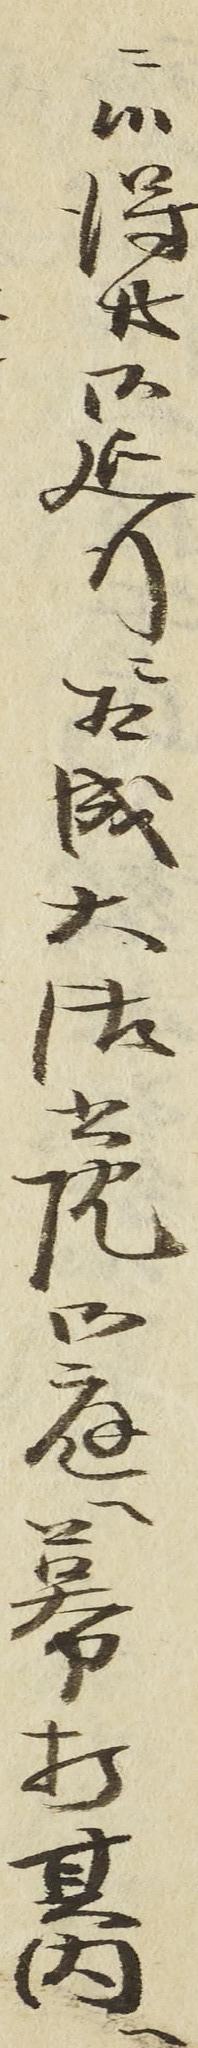二候得共御延引二相成大御書院御庭へ幕打其内へ
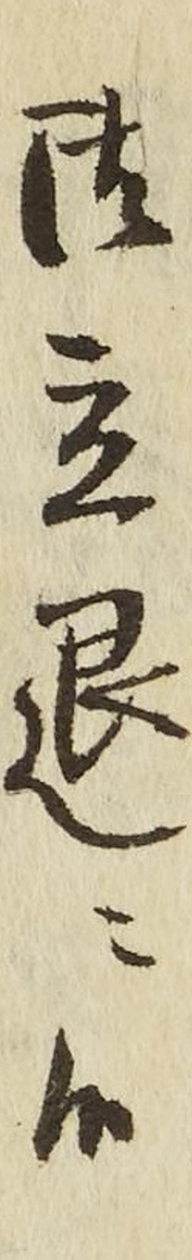御立退二候
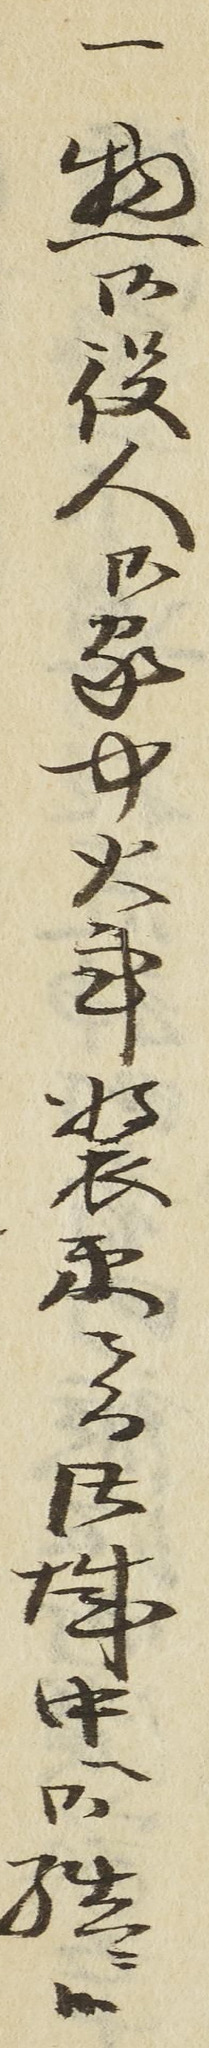一惣御役人御家中火事装束二而御城中へ御詰二候
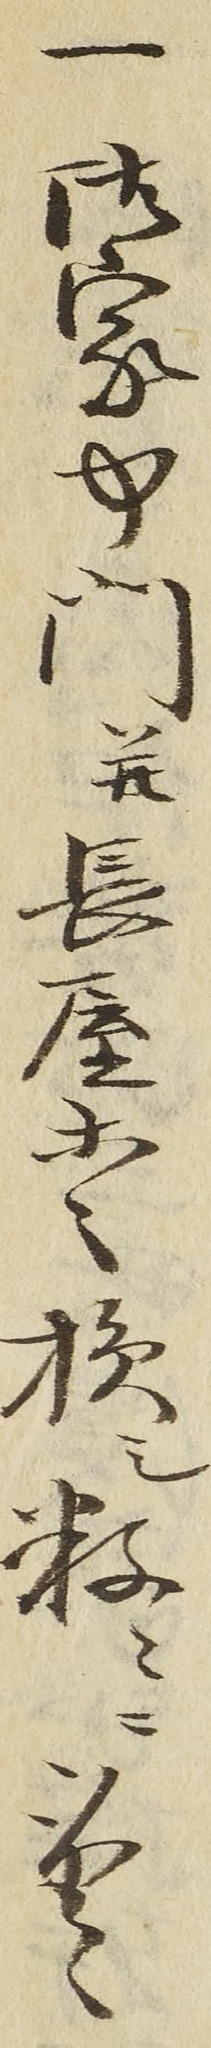一御家中門并長屋等之損し数々二御座候

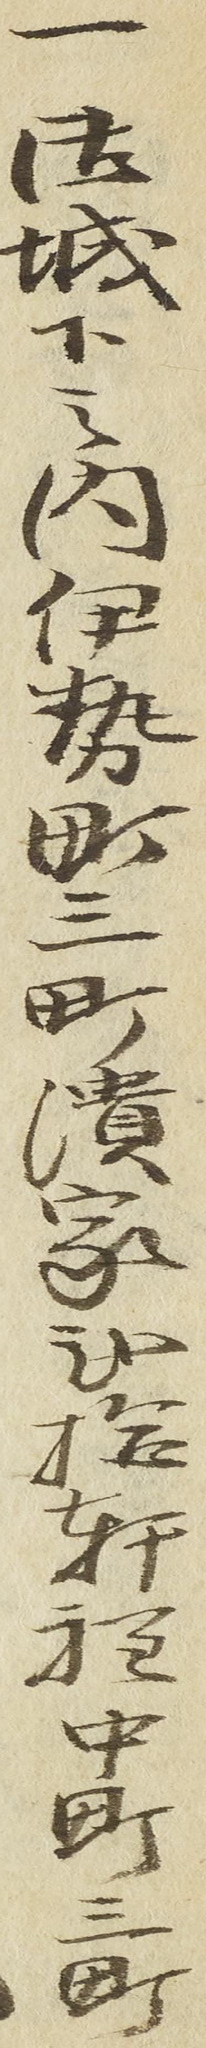一御城下之内伊勢町三町潰家弐拾軒程中町三町
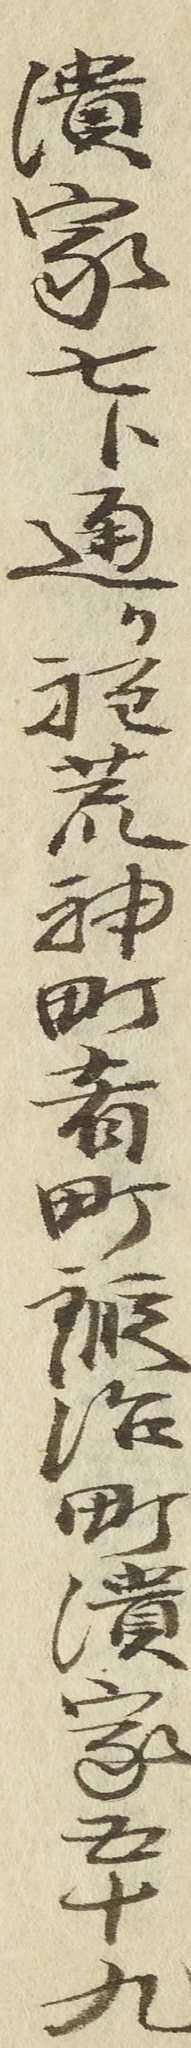潰家七分通り程荒神町肴町鍛治町潰家五十九
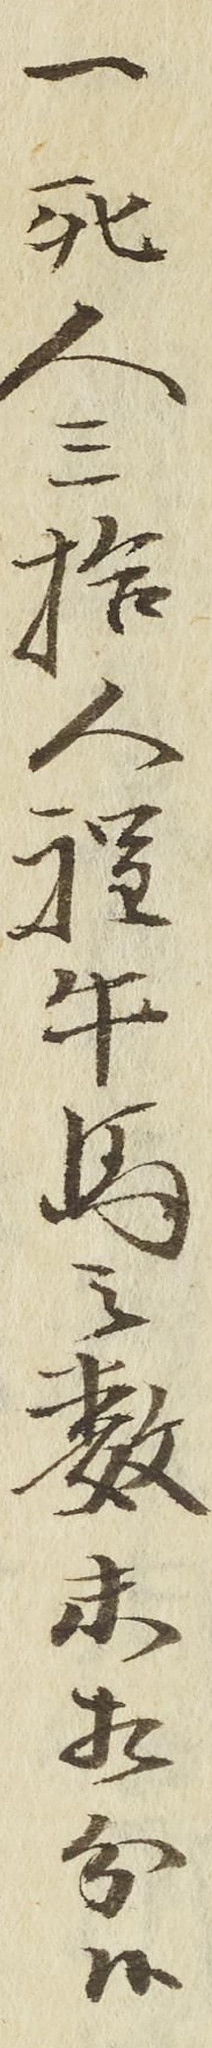一死人三拾人程牛馬之数未相分候
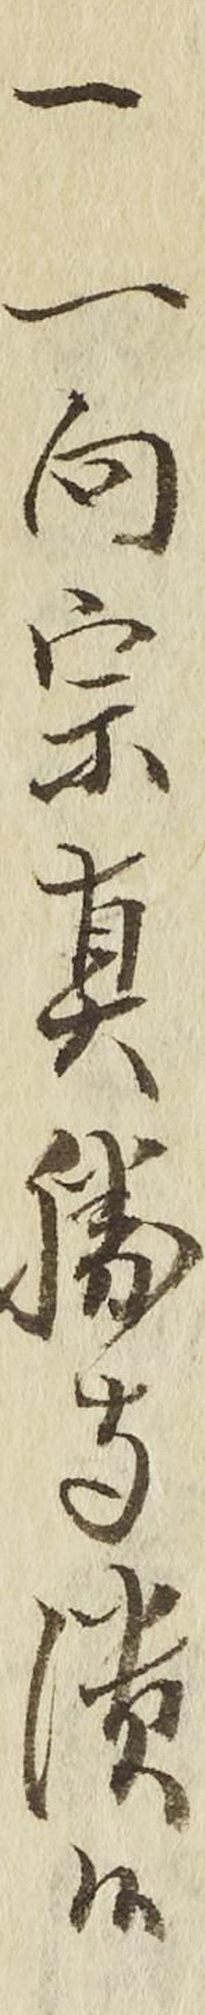一一向宗真勝寺潰候
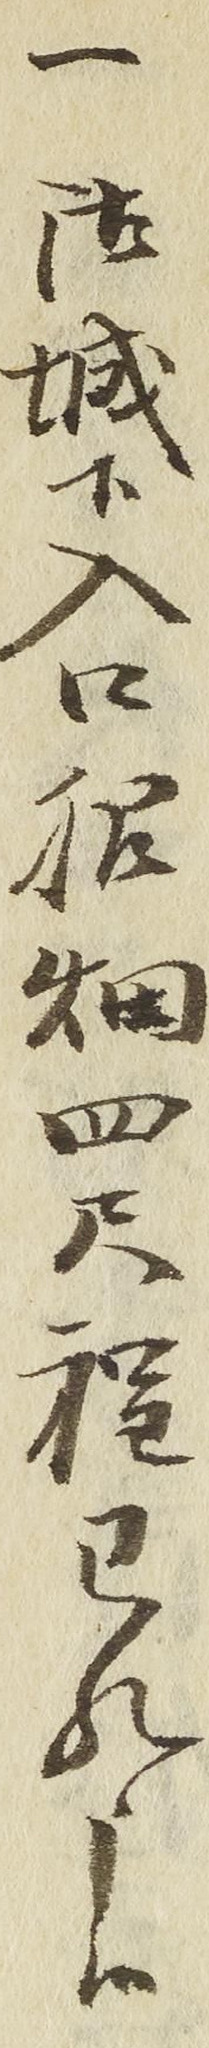一御城下入口脇畑四尺程われ申候
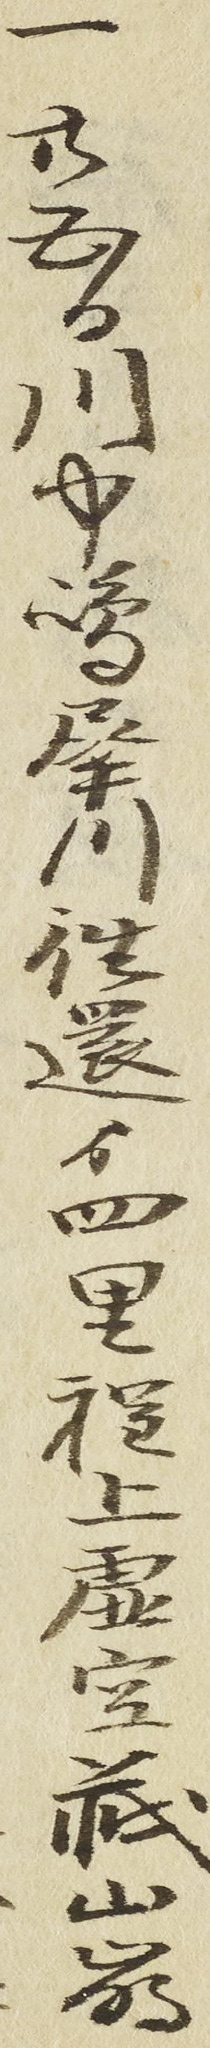一廿五日川中嶋犀川往還ゟ四里程上虚空蔵山崩
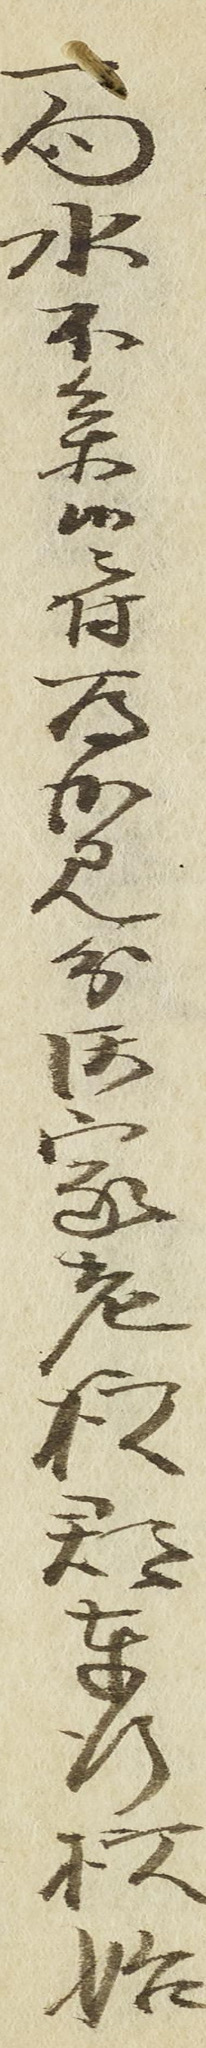一旬水不参候二付為御見分御家老様郡奉行様始め
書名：信濃國大地震記　乾
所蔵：東京大学地震研究所図書室 Earthquake Research Institute Library, The University of Tokyo, JAPAN
